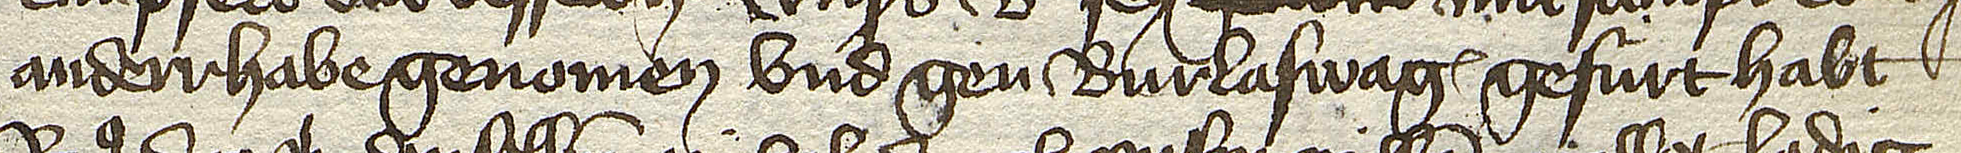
anderr habe genomen vnd gen Burlaſwag* gefürt habt
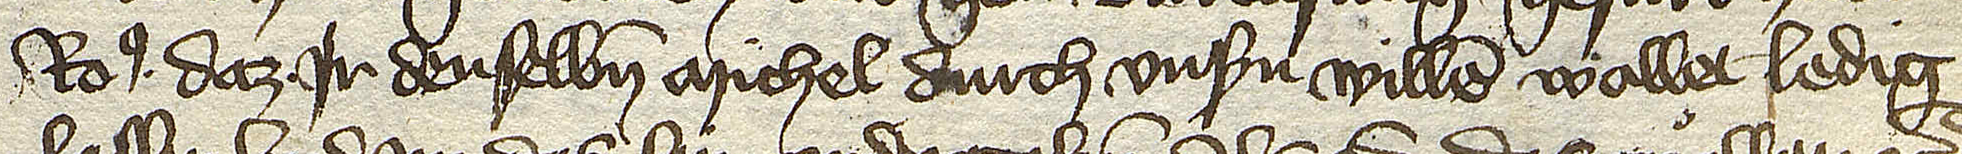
Ro* . daʒ Ir denſelbn* Michel durch vnſ*n wille* wollet ledig
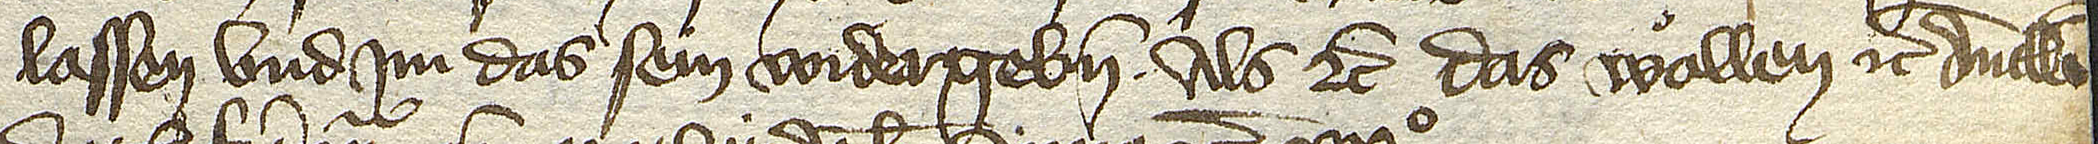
laſſen vnd Im das ſein widergebn* / Als ec* das wöllen ec* Antw*t
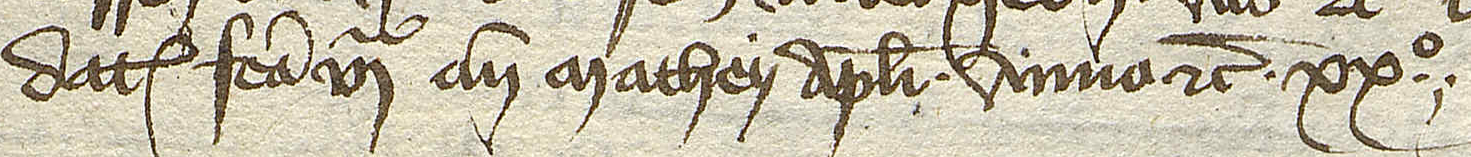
Dat* fea* vi* an* Mathey Apli* . Anno ec* . xx* . , .
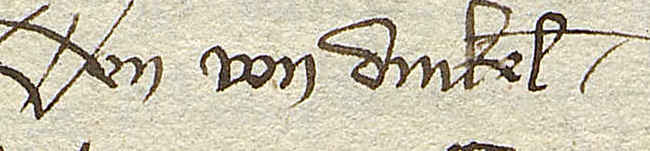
Den von dinkel* /
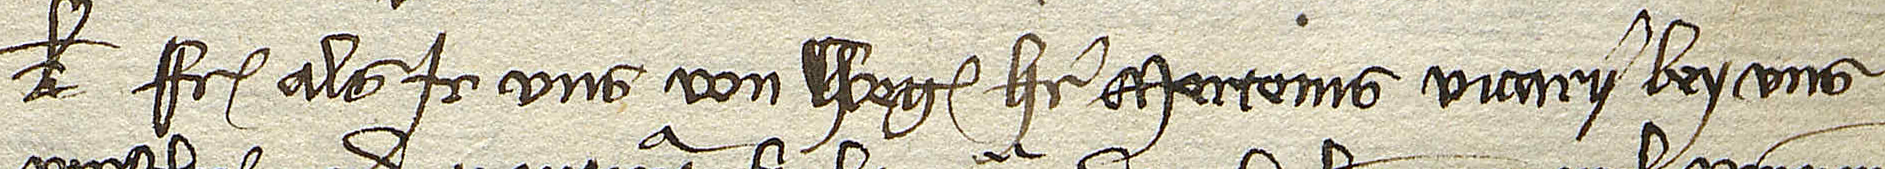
L* fr* als Ir vns von weg* hr* Merteins vicary* bey vns
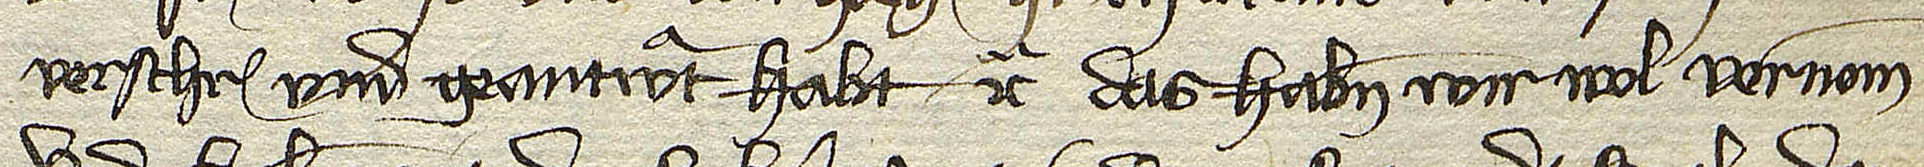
verſchr* vnd geantw*t habt / ec* das habn* wir wol vernom*
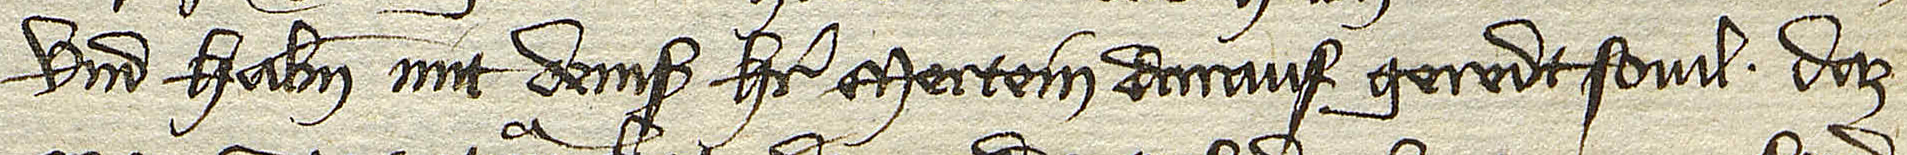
Vnd habn* mit demſ* hr* Mertein darauf geredt ſouil . daʒ
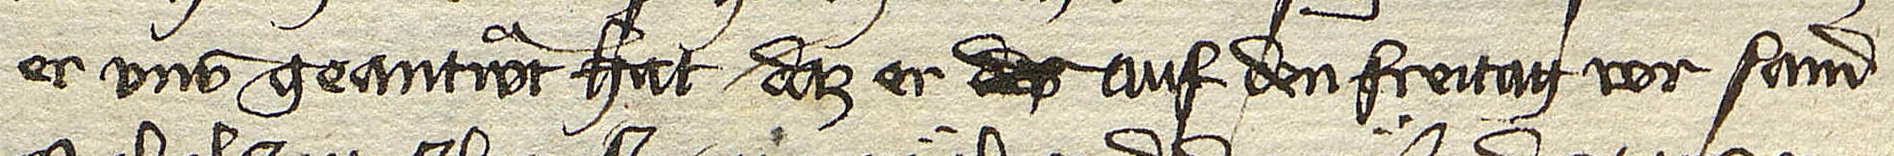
er vns geantw*t hat / daʒ er des auf den freitag vor ſand
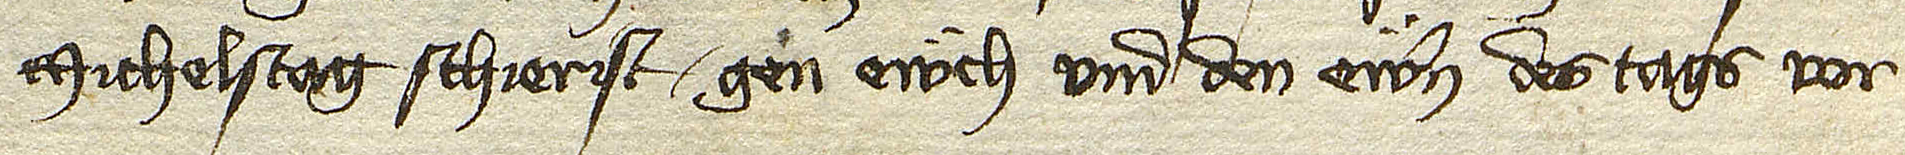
Michelſtag ſchieriſt / gen eẅch vnd den eẅ*n des tags vor
